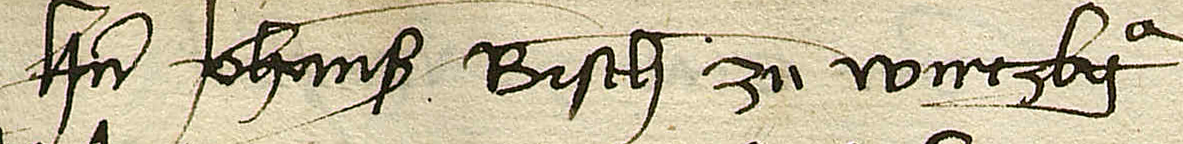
Hn* Iohanſ* Biſch* ʒu wircʒb*g
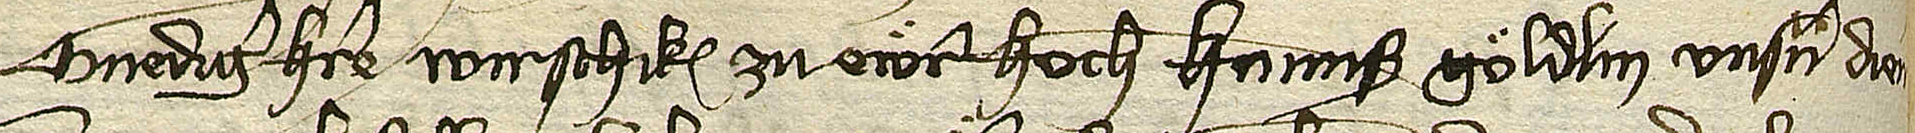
Gnedig* h*re wir ſchik* ʒu eẅr* hoch* Hannſ* göldlin vnſ*n dien*
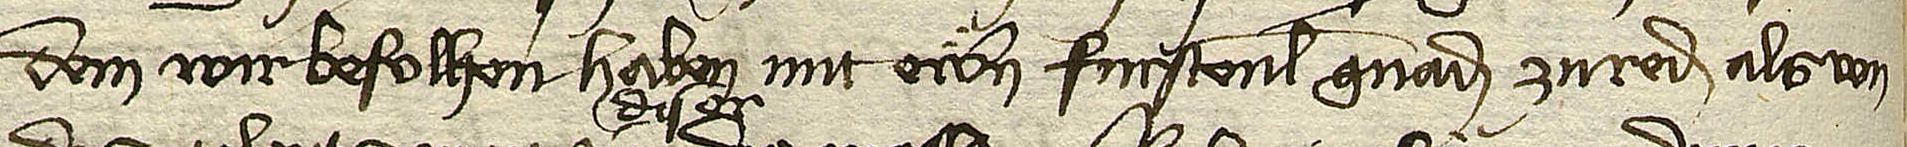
Dem wir befolhen haben mit eẅn* furſtenl* gnad* ʒured* als von
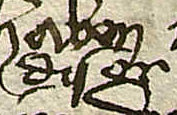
diſer
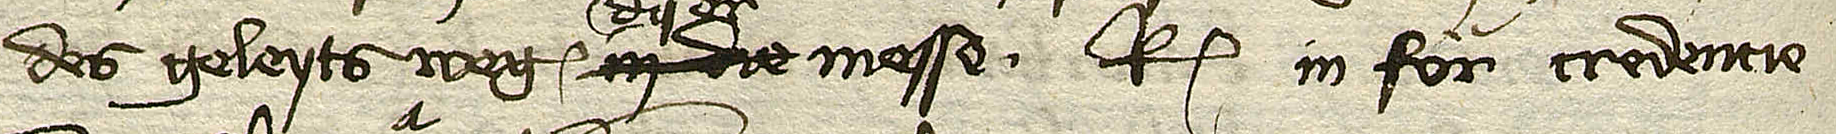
des geleyts weg* in die meſſe . R* in for* credencie
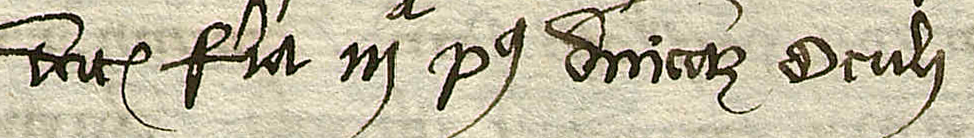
Dat* f*ia iii* p* d*nica* Oculi
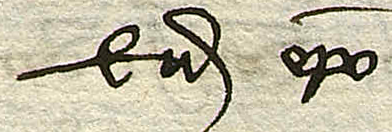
Eid* epo*
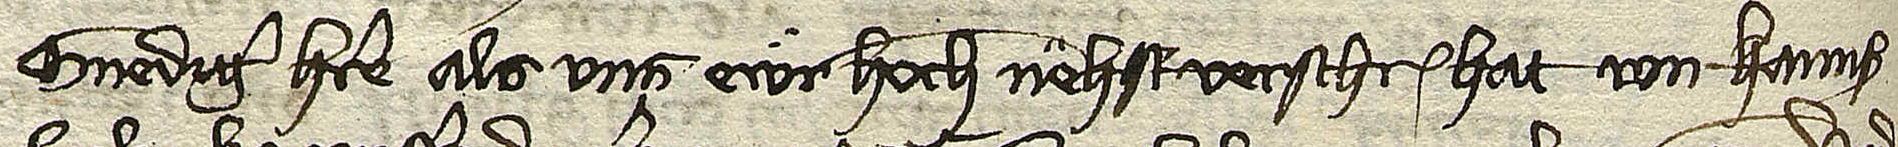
Gnedig* h*re als vns eẅr hoch* nëhſt verſchr* hat von hannſ*
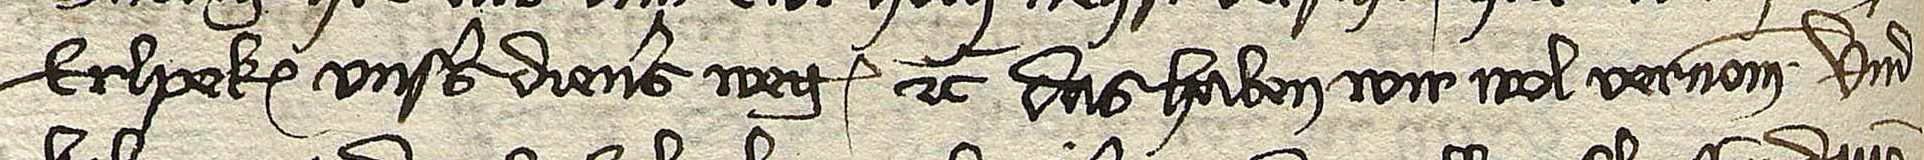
Erlpek* vnſ*s dien*s weg* ec* das haben wir wol vernom* . Vnd
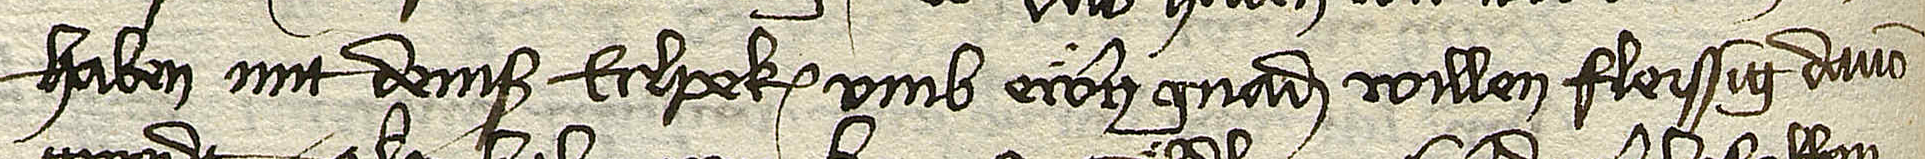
haben mit demſ* Erlpek* vmb eẅ*r gnad* willen fleiſſig dauo*
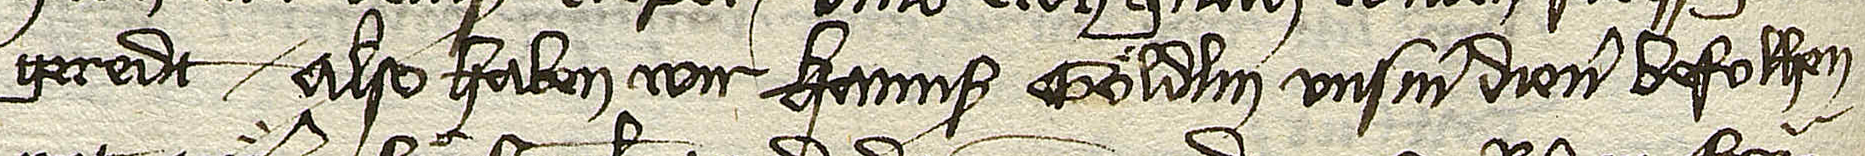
geredt / alſo haben wir Hannſ* Göldlin vnſ*m dien* befolhen
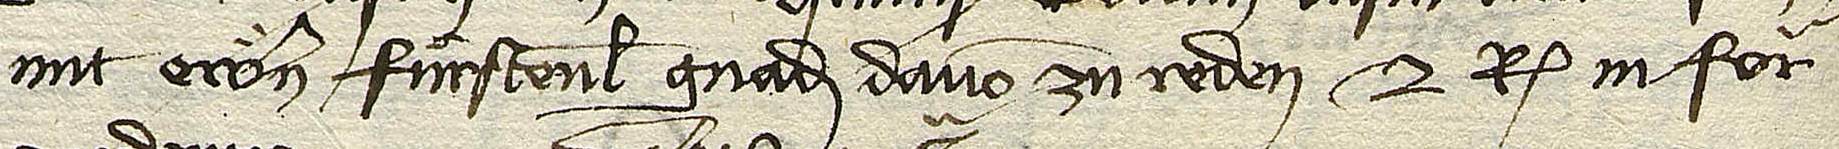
mit eẅ*n fürſtenl* gnad* dauo* ʒu reden / @ R* in for*
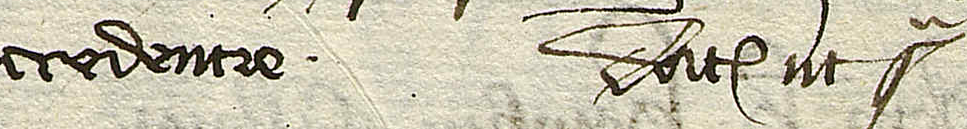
credencie . Dat ut ſ*
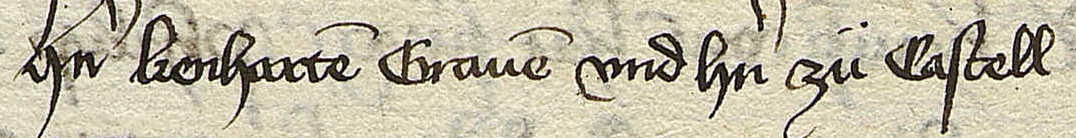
Hn* lienharte* Graue* vnd h*n cʒü Caſtell
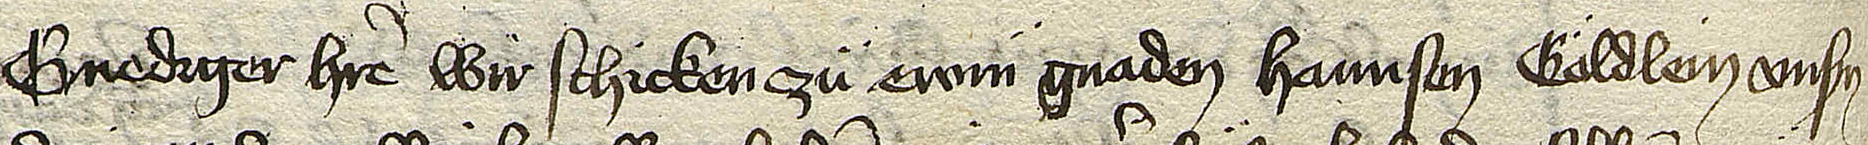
Gnediger h*re wir ſchicken cʒü ewr*n gnaden hannſen Göldlein vnſ*n
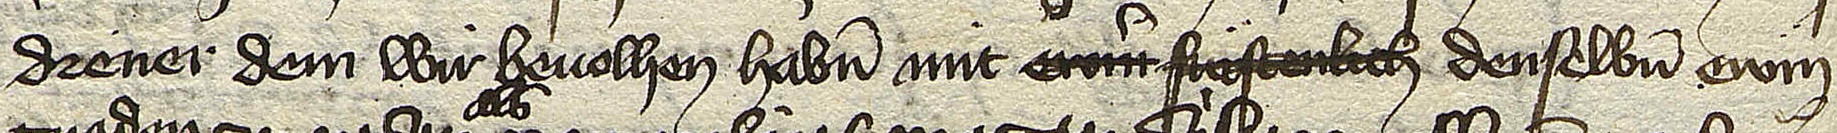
diener dem wir beuolhen hab*n mit ew*rn fürſtenlich denſelb*n ew*rn
